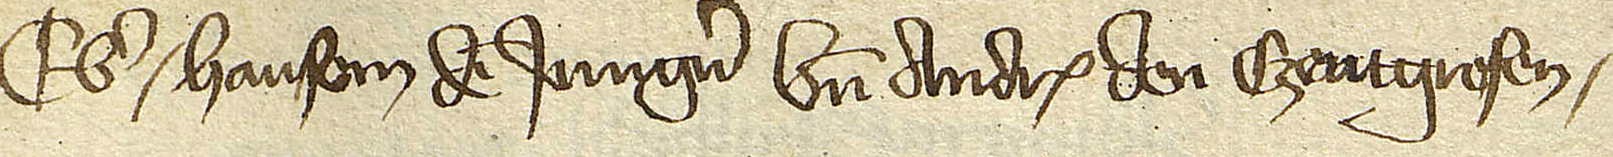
Eb* / hanſem de* Iungn* vn* Andr* den Cʒentgrefen /
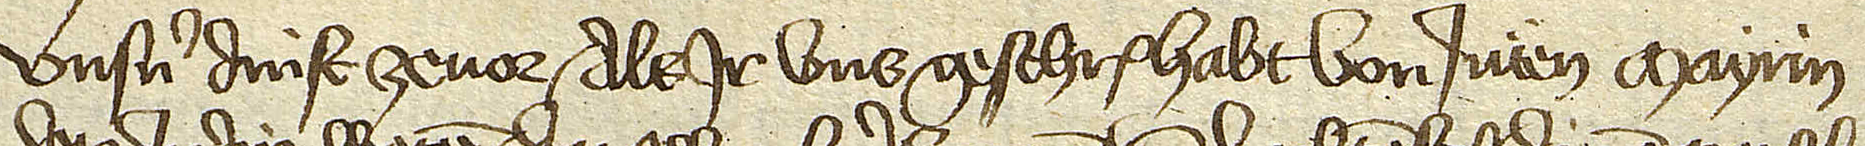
Vnſn* dinſt cʒeuor / Als Ir vns geſchr* habt von Iüten Mayrin
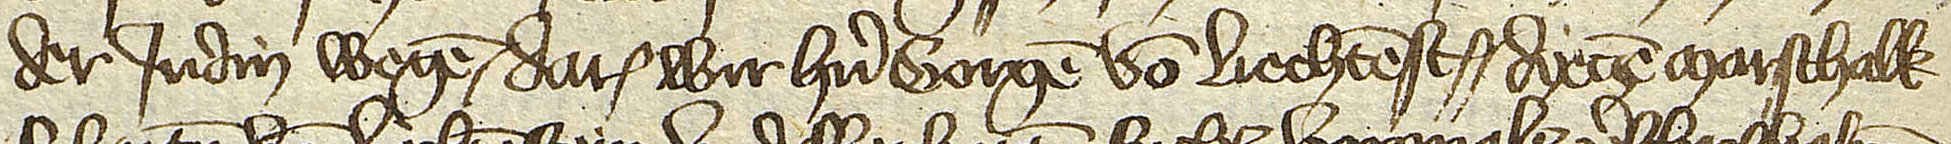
der Iudin wege* / dar* wir hn* Gorge* vo* Liechteſt* / dyecʒe* Marſchalk
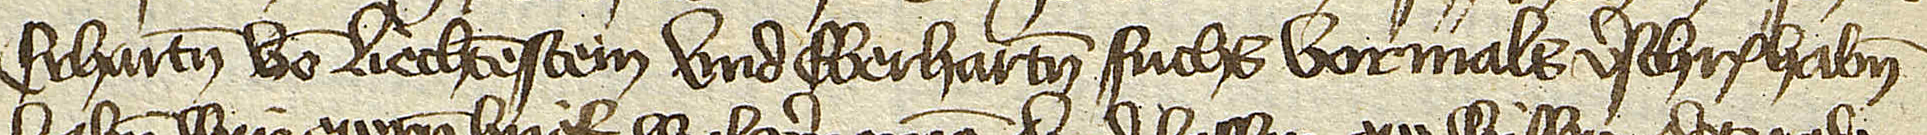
Erhartn* vo* Liechte*ſtein vnd Eberhartn* fuchs vormals v*ſchr* habn*
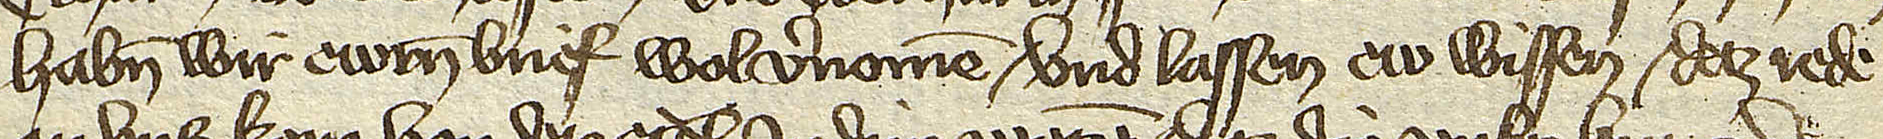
habn* wir ewrn* brief wol v*nome* / vnd laſſen ew wiſſen / daʒ rede
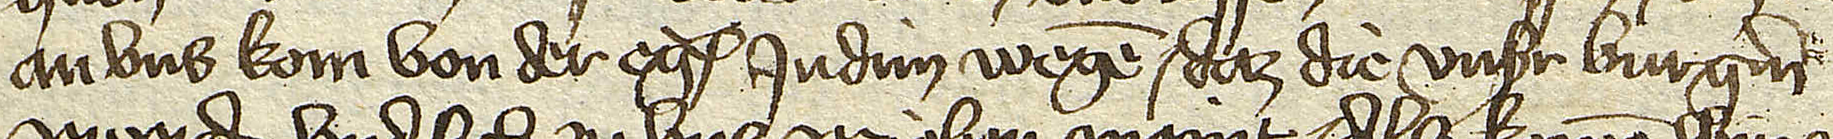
an vns kom von der eg* Iudim wege* / daʒ die vnſ*r burg*in
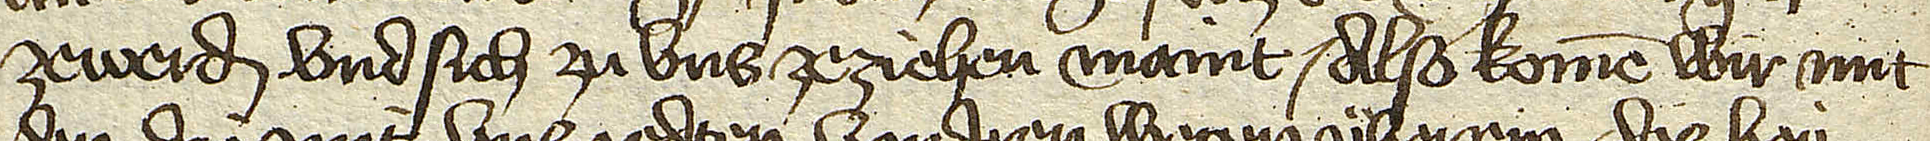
cʒewerd* vnd ſich cʒu vns cʒeʒiehen maint / Alſo kome* wir mit
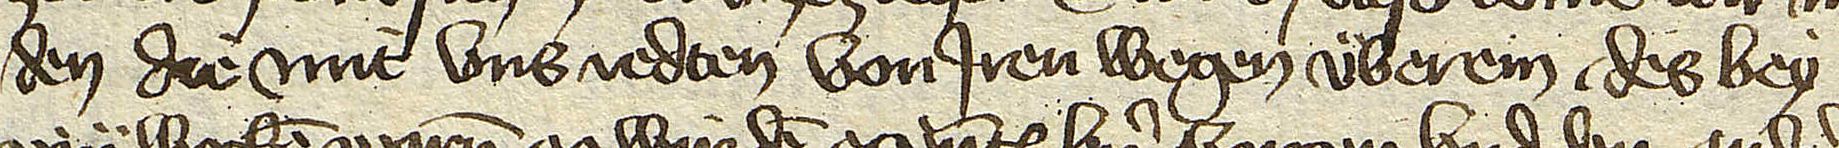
den die mit vns redten von Iren wegen v̈berein / des bey
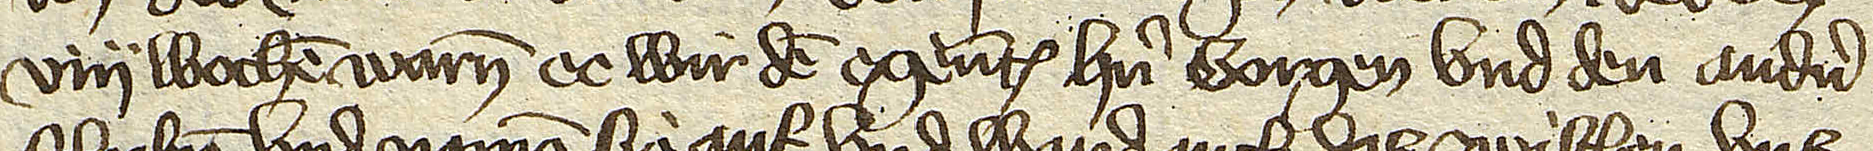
viii woche* warn* ee wir de* egent* hn* Gorgen vnd den andn*
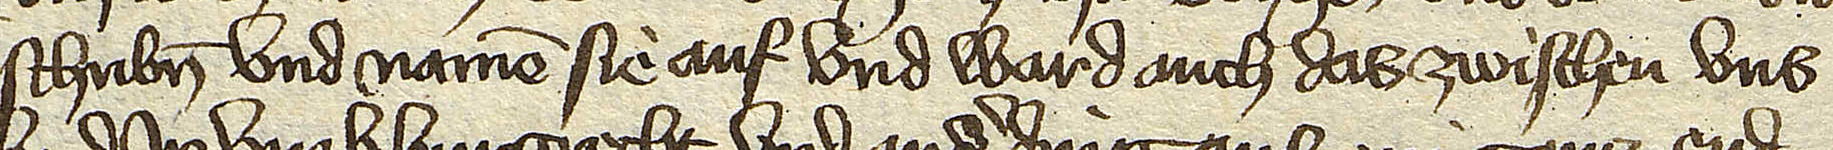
ſchribn* vnd name* ſie auf vnd ward auch das cʒwiſchen vns
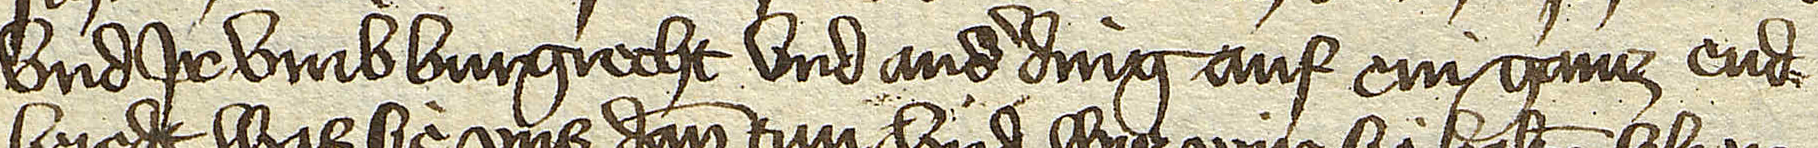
vnd Ir vmb burgrecht vnd and* ding auf ein gancʒ end
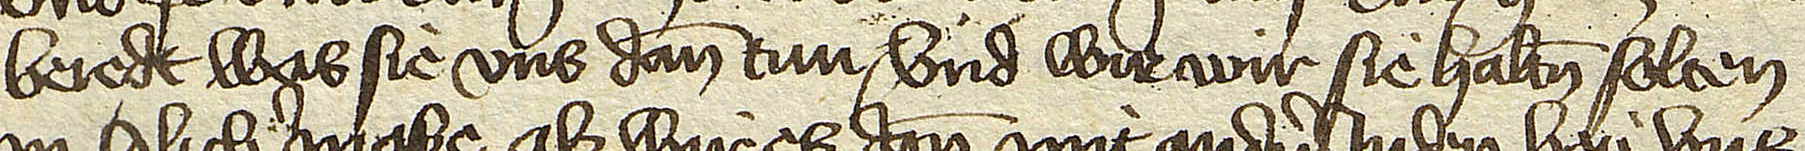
beredt was ſie vns dan* tun / vnd wie wir ſie haltn* ſolten
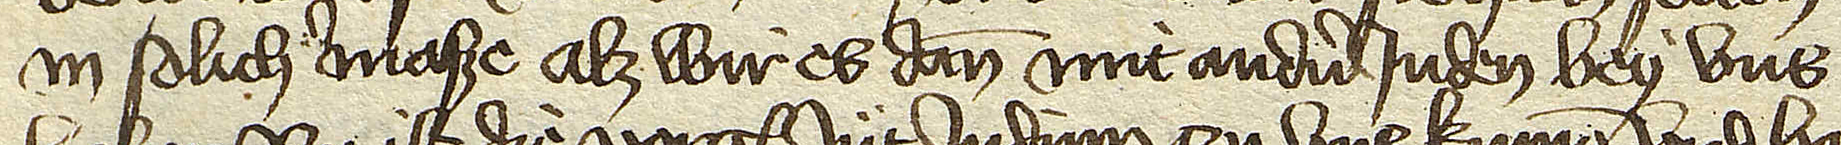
in ſolich maſʒe als wir es dan* mit andn* Iuden bey vns
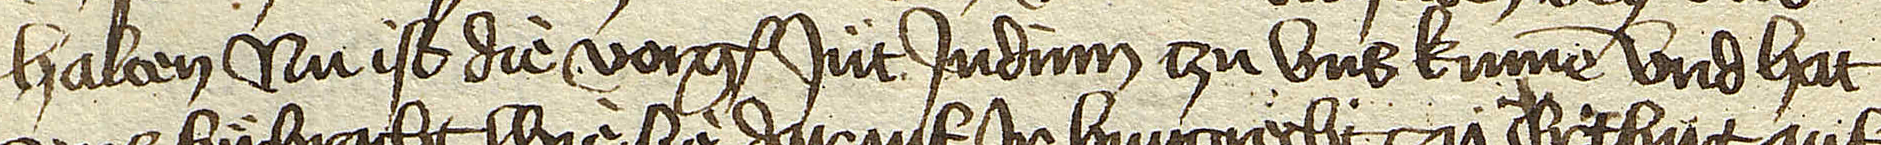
halten Nu iſt die vorg* Iüt Iudinn cʒu vns kume* vnd hat
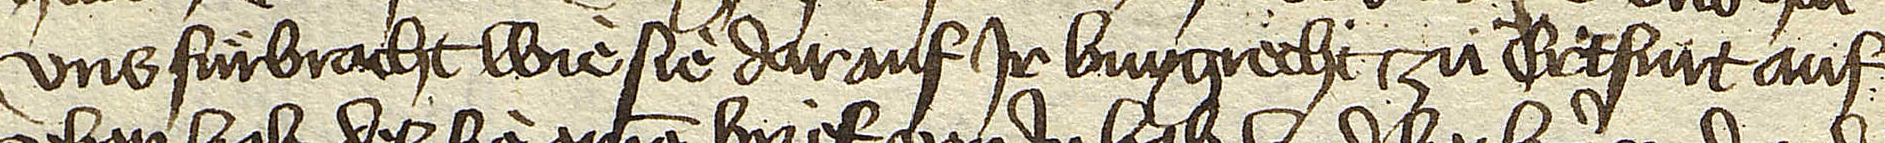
vns fürbracht wie ſie darauf Ir burgrecht cʒü Ertfurt auf
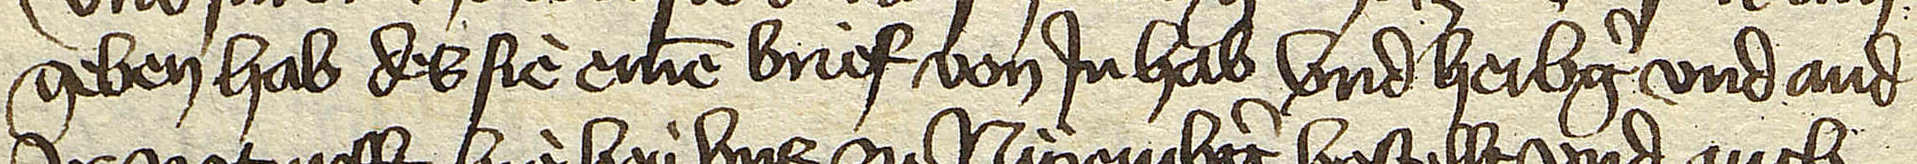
geben hab des ſie eine* brief von In hab vnd herbg* vnd and*
